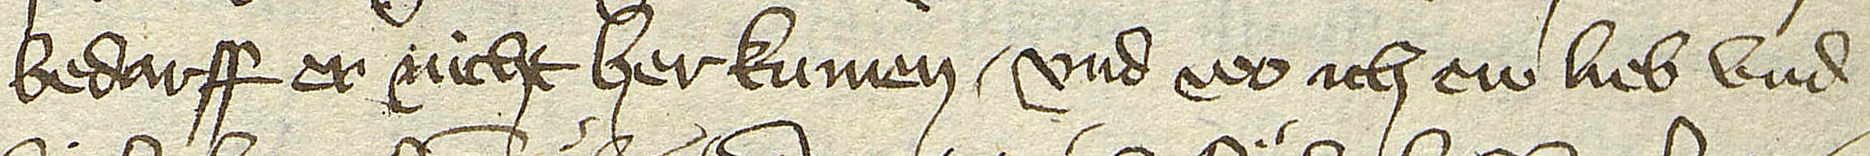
bedarff er nicht herkumen / vnd wo ich ew lieb vnd
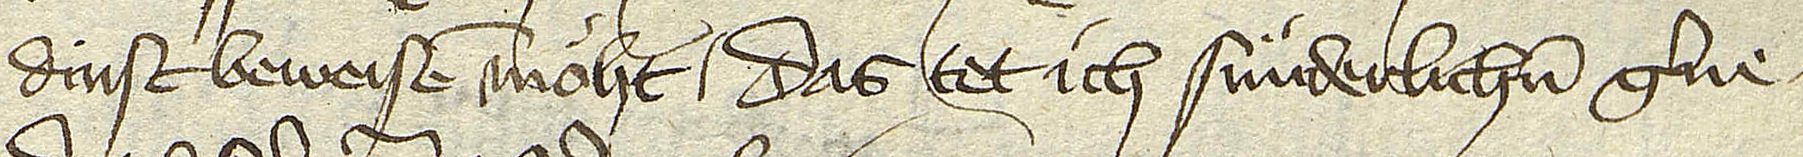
dinſt beweiſe* möht / Das tet* ich ſünderlichn* g*ne /
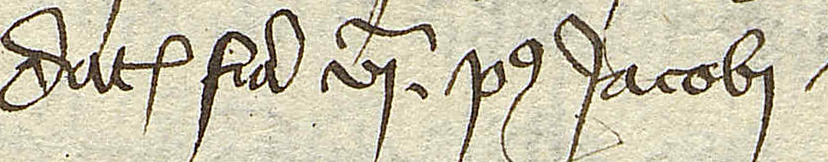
Dat* fia* vi* . p* Iacobi /
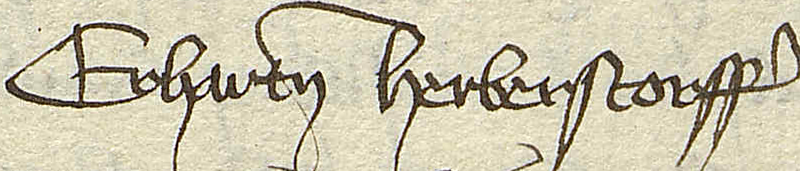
Erhartn* herberſtorff*
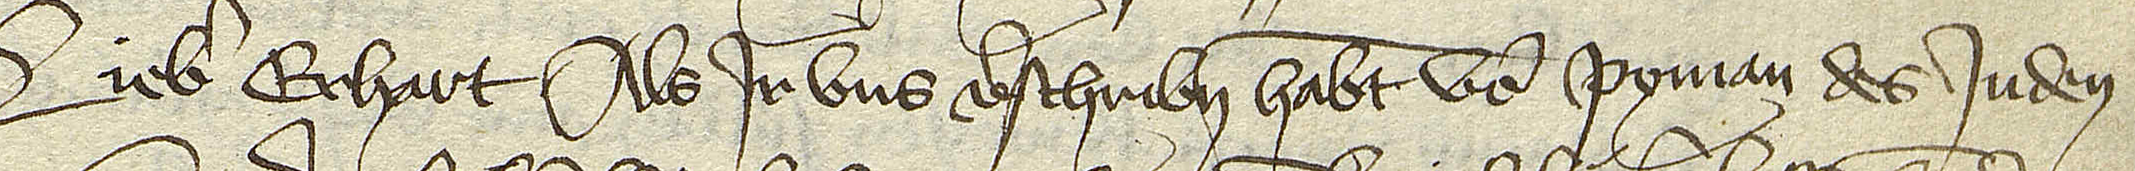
Lieb* Erhart / Als Ir vns v*ſchribn* habt / vo* pyman des Iuden
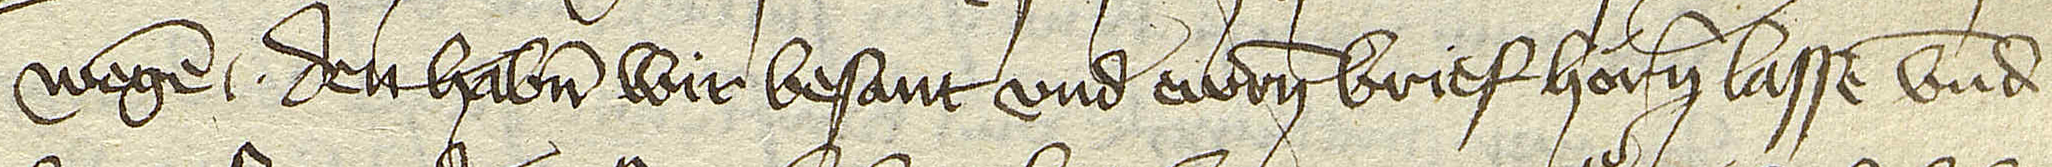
wege* / . den habn* wir beſant vnd ewrn* brief hörn* laſſe* vnd
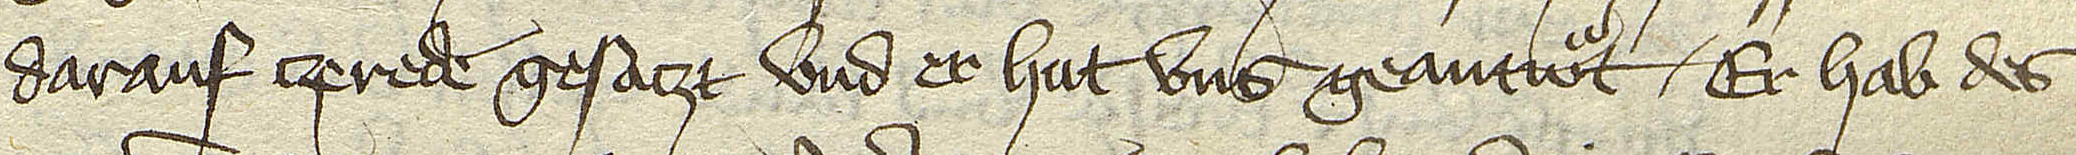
darauf cʒerede geſacʒt vnd er hat vnd geantwt* / Er hab des
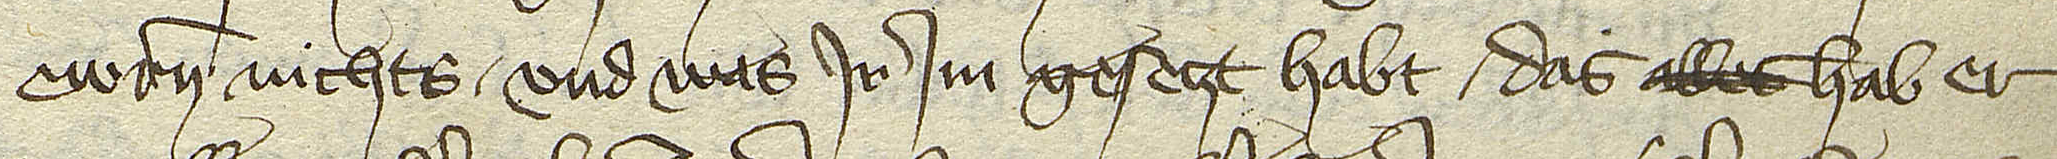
ewrn* nichts / vnd was Ir Im geſecʒt habt / das alles hab er
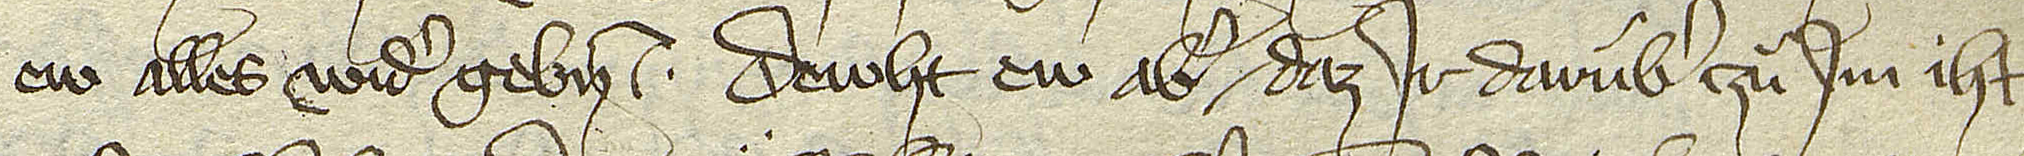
ew alles wid* gebn* / . Dewht ew ab* / daʒ Ir darüb* cʒü Im iht
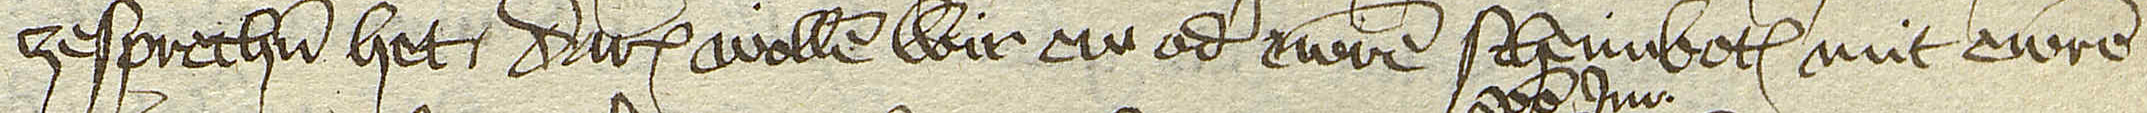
cʒeſprechn* het / Dar* wölle* wir ew od* ewre* ſcheinbot* mit ewre*
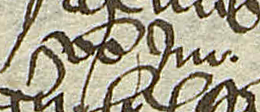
vo* Im
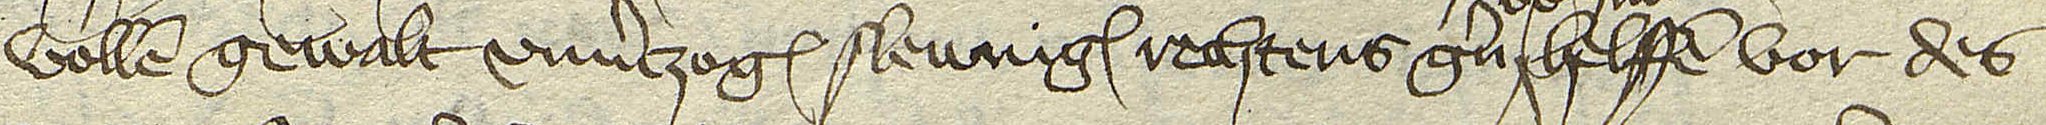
volle* gewalt vnu*cʒog* ſlewnig* rechtens g*n helffe* vor des
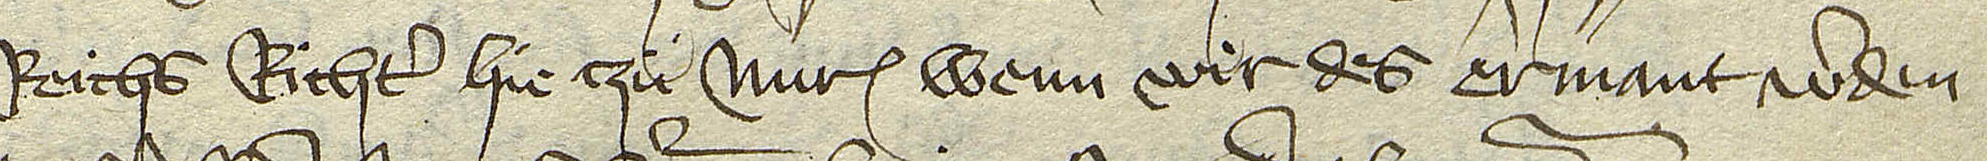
Reichs Richt* hie cʒü Nur* wenn wir des ermant w*den
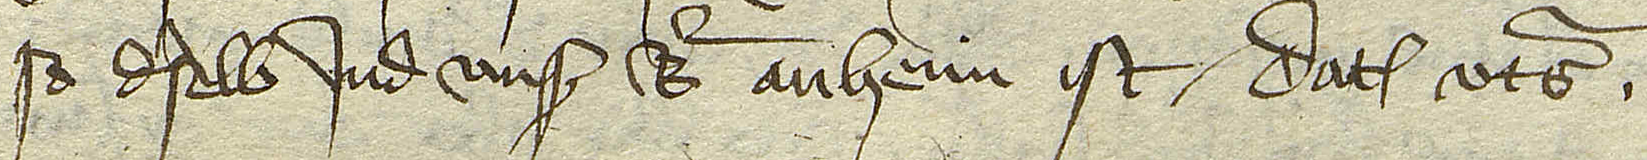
ſo d*ſelb Iud vnſ* B* anheim iſt / Dat* vts* .
